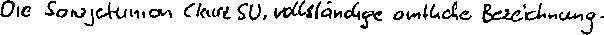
Die Sowjetunion (kurz SU, vollständige amtliche Bezeichnung
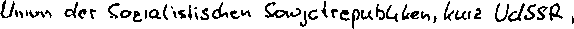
Union der Sozialistischen Sowjetrepubliken, kurz UdSSR,
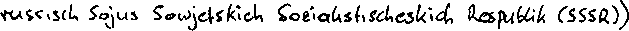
russisch Sojus Sowjetskich Sozialistitscheskich Respublik (SSSR))
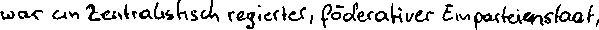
war ein zentralistisch regierter, föderativer Einparteienstaat,
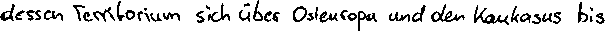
dessen Territorium sich über Osteuropa und den Kaukasus bis
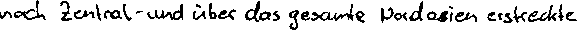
nach Zentral- und über das gesamte Nordasien erstreckte
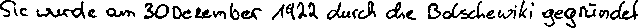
Sie wurde am 30. Dezember 1922 durch die Bolschewiki gegründet
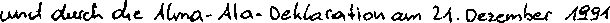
und durch die Alma-Ata-Deklaration am 21. Dezember 1991
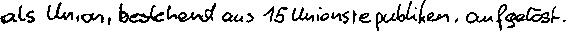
als Union, bestehend aus 15 Unionsrepubliken, aufgelöst.
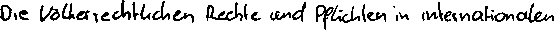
Die völkerrechtlichen Rechte und Pflichten in internationalen
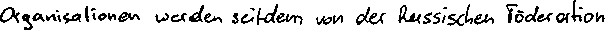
Organisationen werden seitdem von der Russischen Föderation
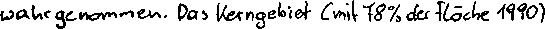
Wahrgenommen. Das Kerngebiet (mit 78 % der Fläche 1990)
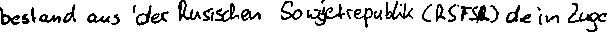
bestand aus der Russischen Sowjetrepublik (RSFSR), die im Zuge
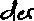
der
